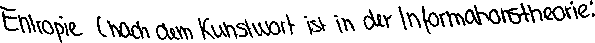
Entropie (nach dem Kunstwort ist in der Informationstheorie:
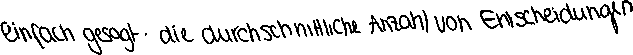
einfach gesagt: die durchschnittliche Anzahl von Entscheidungen
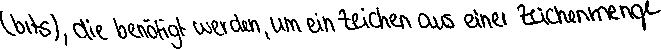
(bits), die benötigt werden, um ein Zeichen aus einer Zeichenmenge
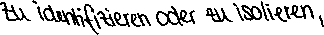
zu identifizieren oder zu isolieren,
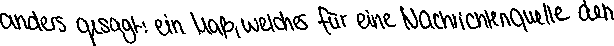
anders gesagt: ein Maß, welches für eine Nachrichtenquelle den
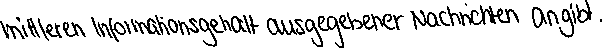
mittleren Informationsgehalt ausgegebener Nachrichten angibt.
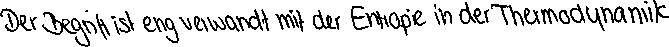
Der Begriff ist eng verwandt mit der Entropie in der Thermodynamik
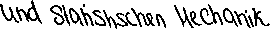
und statistischen Mechanik.
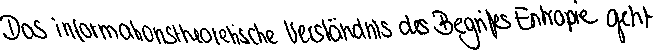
Das informationstheoretische Verständnis des Begriffes Entropie geht
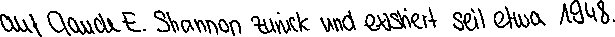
auf Claude E. Shannon zurück und existiert seit etwa 1948.
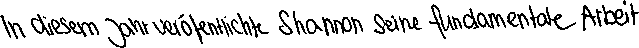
In diesem Jahr veröffentlichte Shannon seine fundamentale Arbeit
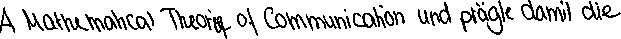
A Mathematical Theory of Communication und prägte damit die
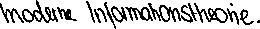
moderne Informationstheorie.
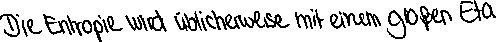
Die Entropie wird üblicherweise mit einem großen Eta
